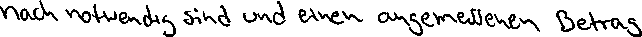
nach notwendig sind und einen angemessenen Betrag
